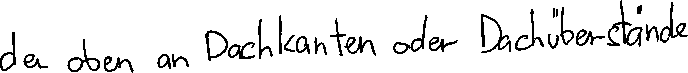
der oben an Dachkanten oder Dachüberstände
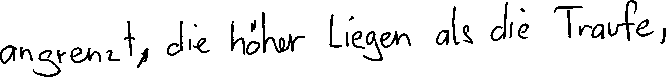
angrenzt, die höher liegen als die Traufe,
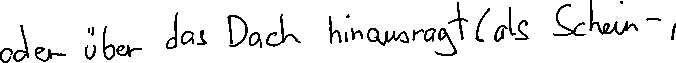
oder über das Dach hinausragt (als Schein-,
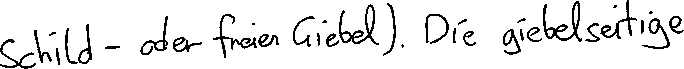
Schild- oder freier Giebel). Die giebelseitige
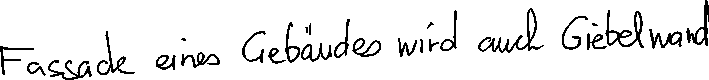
Fassade eines Gebäudes wird auch Giebelwand
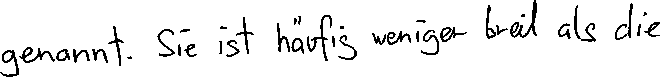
genannt. Sie ist häufig weniger breit als die
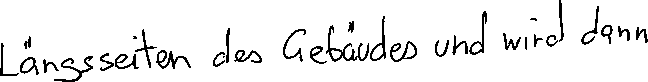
Längsseiten des Gebäudes und wird dann
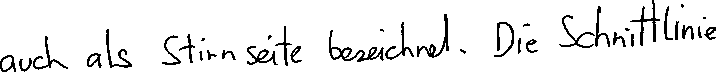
auch als Stirnseite bezeichnet. Die Schnittlinie
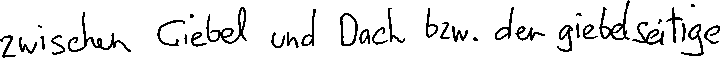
zwischen Giebel und Dach bzw. der giebelseitige
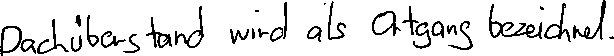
Dachüberstand wird als Ortgang bezeichnet.
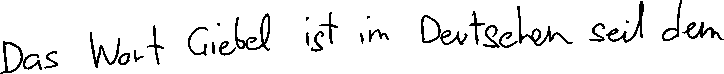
Das Wort Giebel ist im Deutschen seit dem
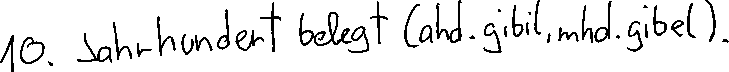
10. Jahrhundert belegt (ahd. gibil, mhd. gibel).
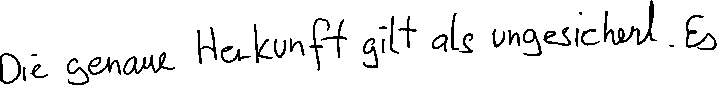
Die genaue Herkunft gilt als ungesichert. Es
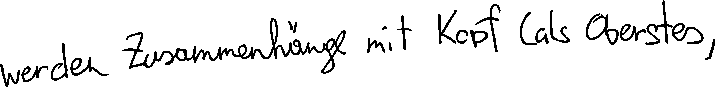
werden Zusammenhänge mit Kopf (als Oberstes,
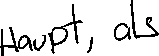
Haupt), als
